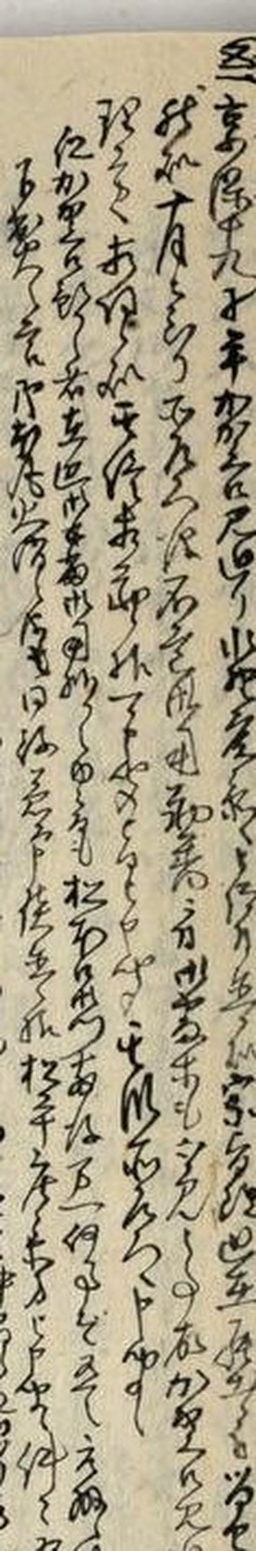理方へ相伺候処其侭相勤候様可申聞候旨被申聞其段所左衛門へ申聞候
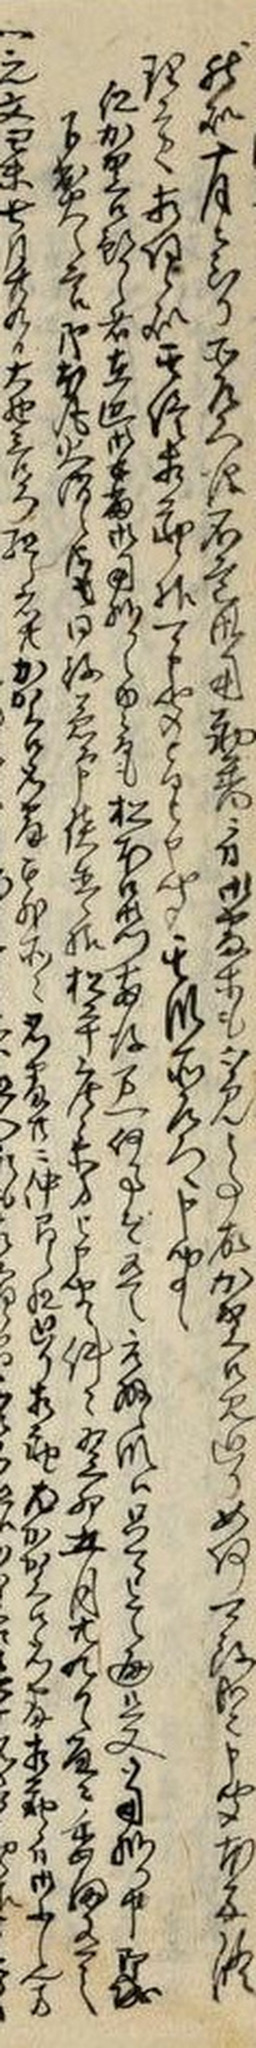但加賀口預り之者在辺御番御用掛り之内に而も松本口御門前後万一何事ぞ有之取扱候段は是迄之通且又御用掛り中御城
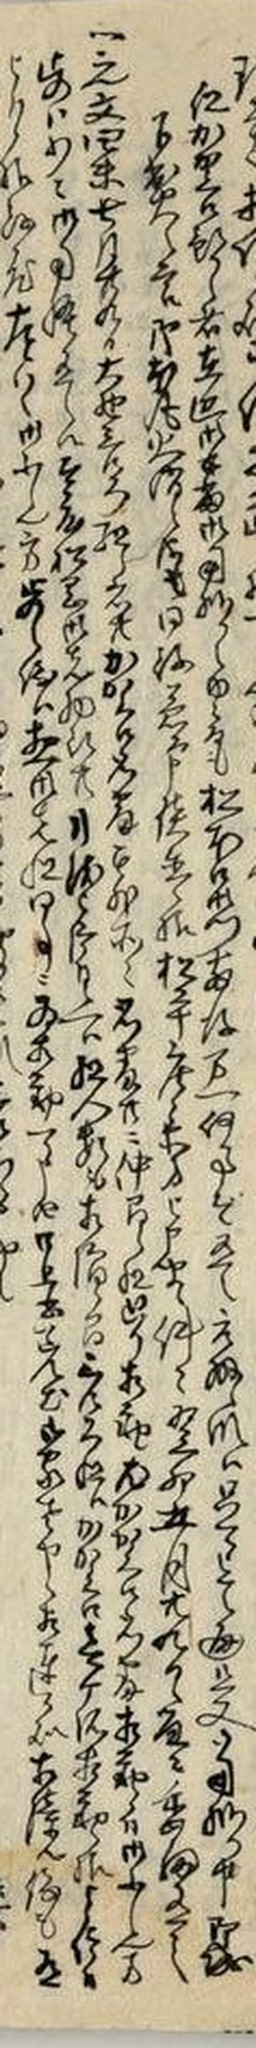一元文四未七月廿九日大野三左衛門組之者共加賀口御門番其外所々御門番共に仲間之組廻り相勤候尤加賀口御門番相勤候付御ふしん方
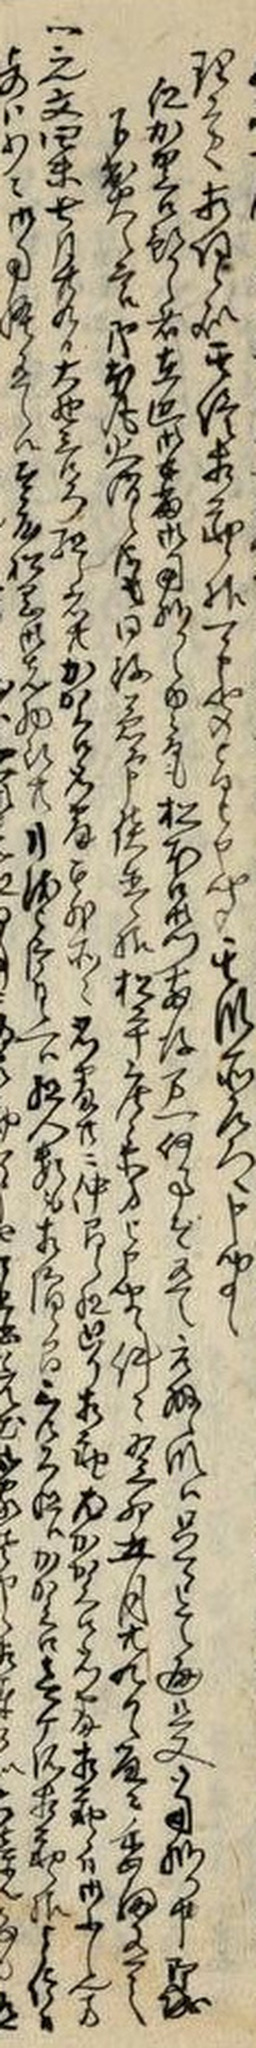下出火之節御本丸火消之儀も同役兼而申談置候様松平庄兵衛方被申聞候件々翌卯五月廿九日之留に委細有之
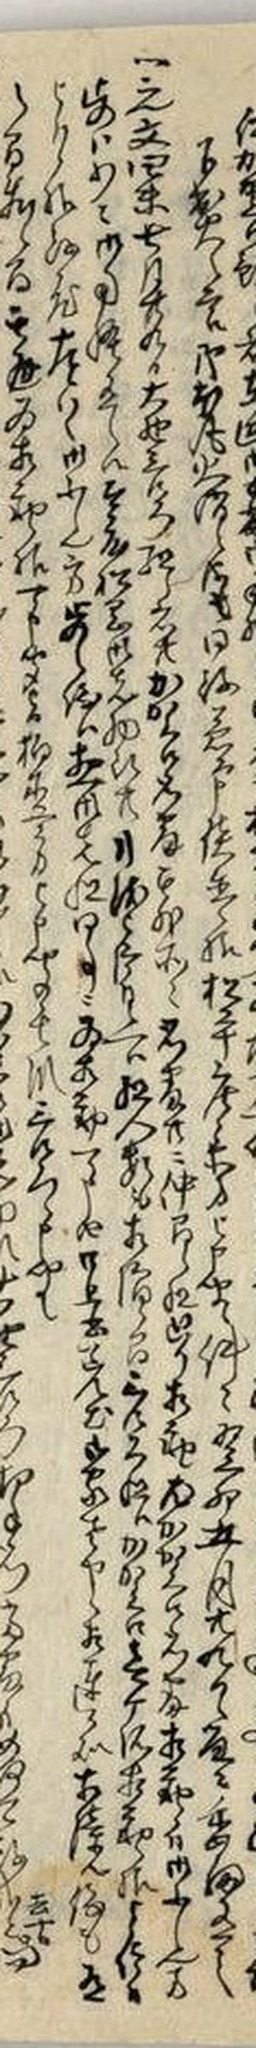歩は少々御用捨有之候今度松岡御先物頭共引越被仰付候へは組人数も相増候間三左衛門組は加賀口壱ケ所相勤候様被仰付
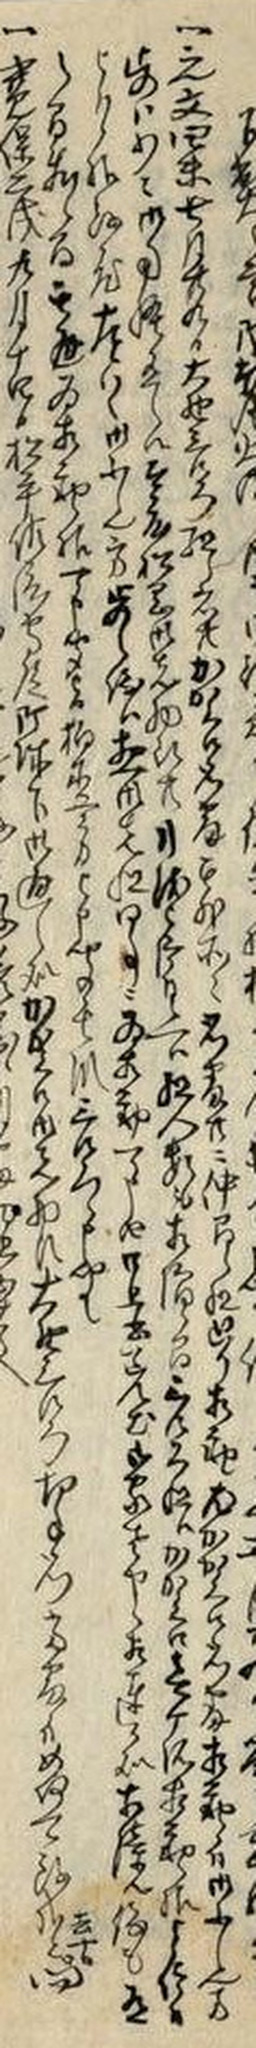被下候様致度左候候はゝ御ふしん方歩之儀は惣御先組同事に為相勤可申由口上書差出御家老中へ相達候処相談候儀も有
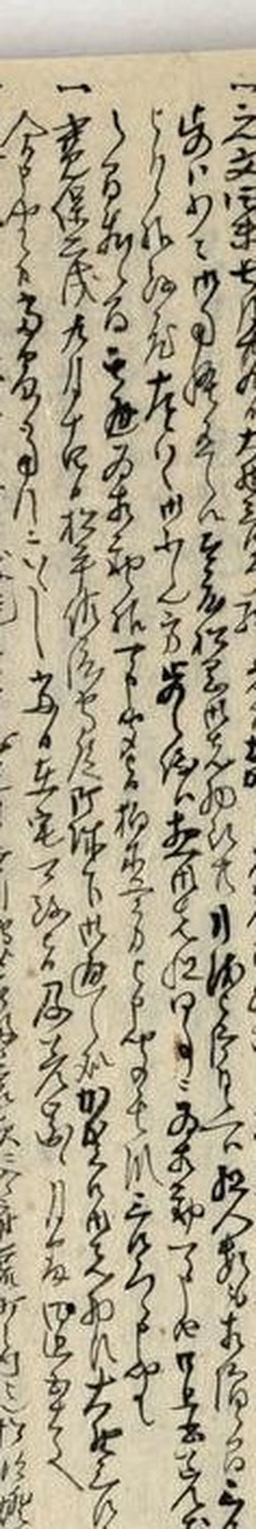之間敷候間其通為相勤候様可申聞旨狛杢方被申聞其段三左衛門被申聞候
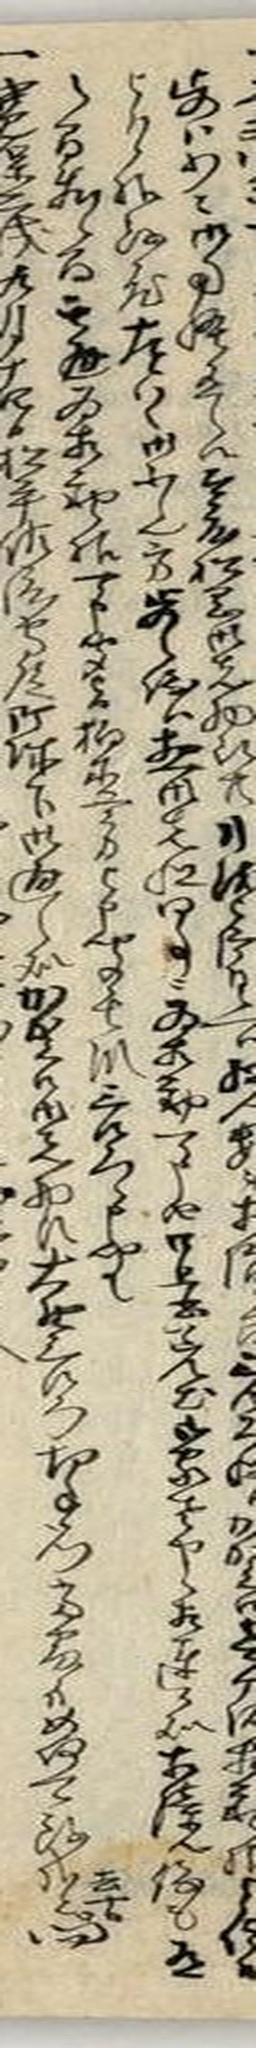一寛保二戌九月十四日松平佐渡守殿御城下御通候処加賀口御先物頭大野三左衛門切手御門当番に付如何可被致哉と去十日問
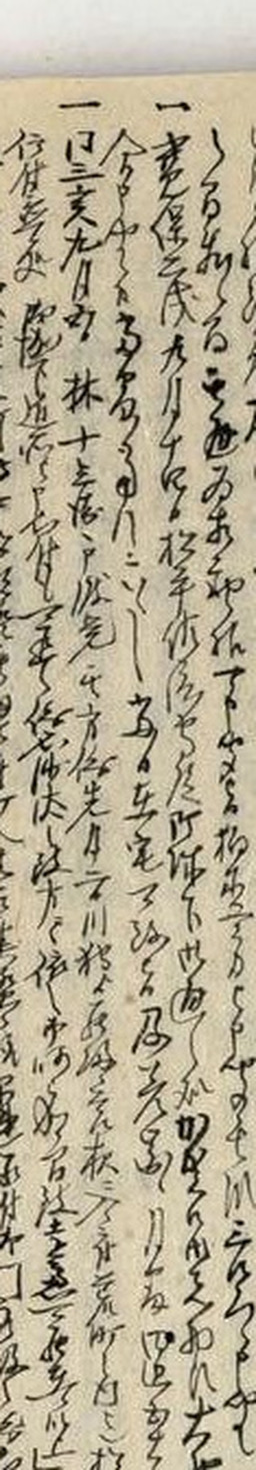合申聞候付当番御用引にいたし当日在宅可致旨及差図候月番田辺五太夫
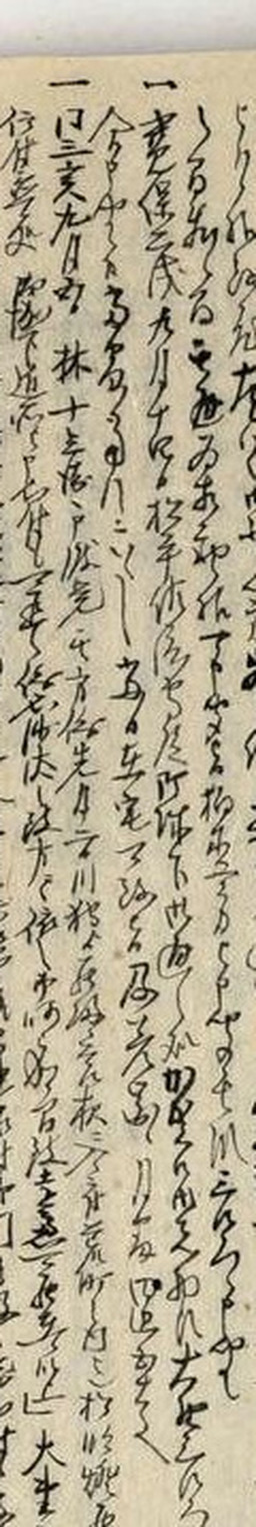合申聞候付当番御用引にいたし当日在宅可致旨及差図候月番田辺五太夫

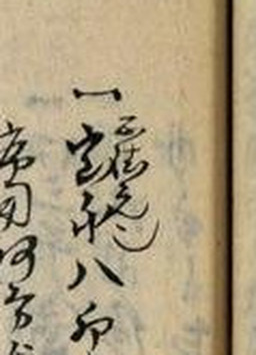正徳元也
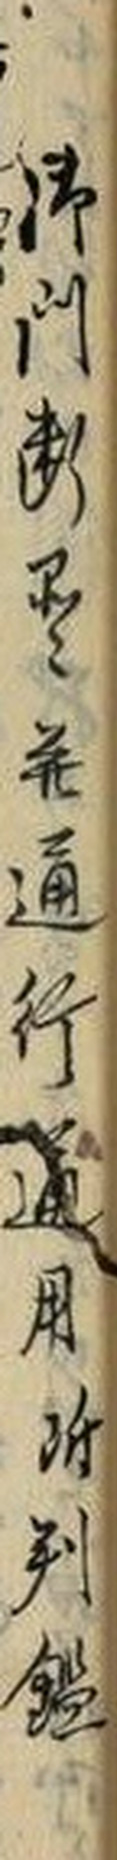御門断品々并通行通用附判鑑
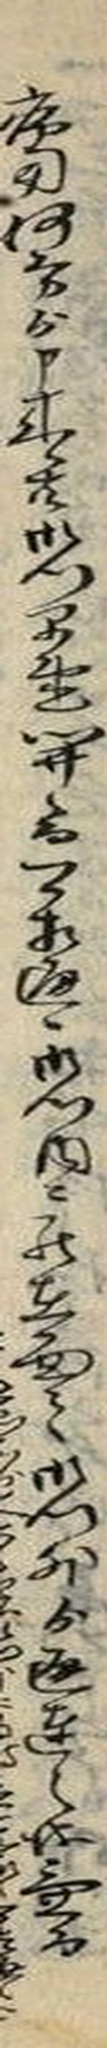病用何方ゟ申来候共御門早速開候而可相通候御門内に罷在候面々へ御門外ゟ通達之儀兼而
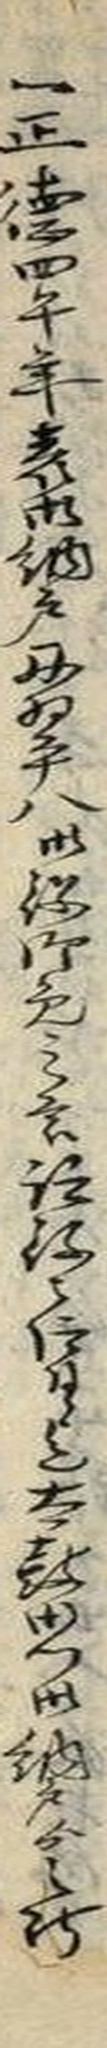一正徳四午年表御納戸丹羽平八御役御免之節跡役被仰付候迄太鼓御門御納戸ゟ之断
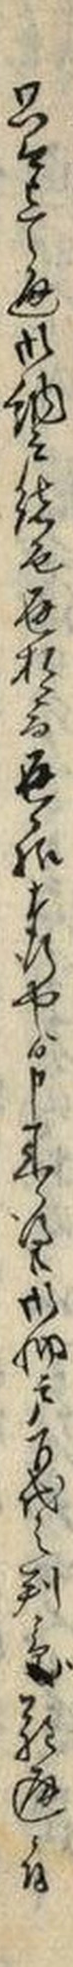只今迄之通御納戸諸色通札に而通候様奉行中ゟ申来候得共御納戸下代之判に而は難通に付
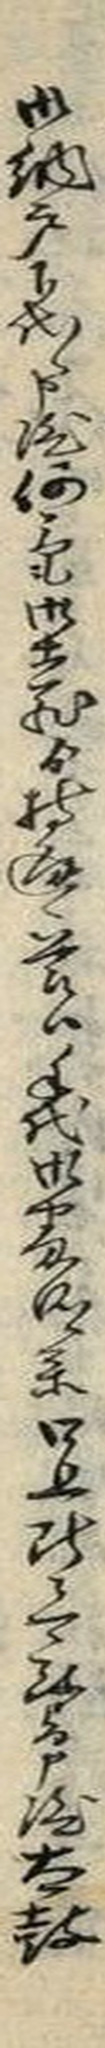御納戸下代へ申渡何に而も御土蔵ゟ持通候節は手代御番所へ参口上断に可致旨申渡太鼓
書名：御門御櫓之部
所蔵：福井県文書館 Fukui Prefectural Archives
